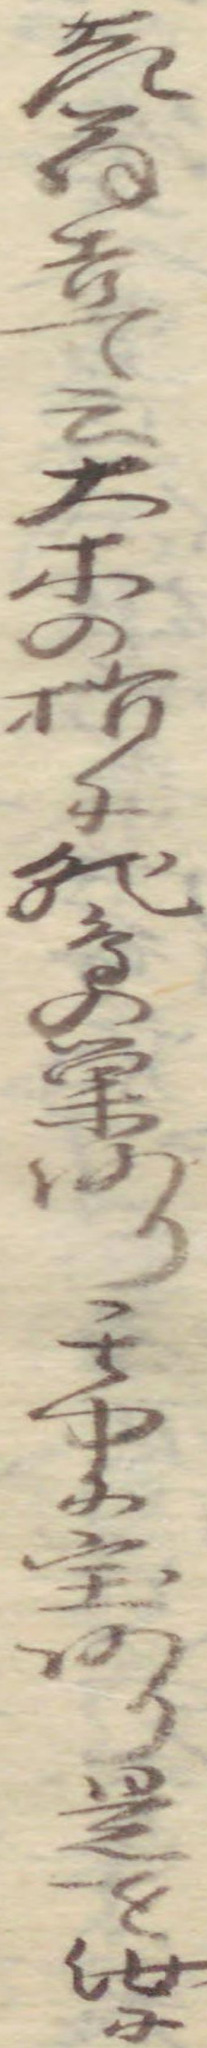老翁告て云大木の梢に鷲の巣あり其中に宝あり是を汝に
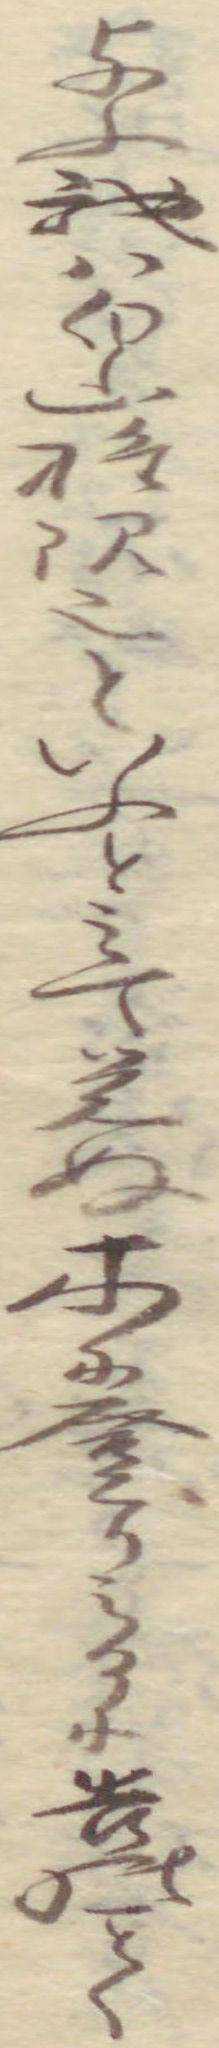与ふ我は白山権現也といふとみて覚ぬ木に登りみるに告のことく
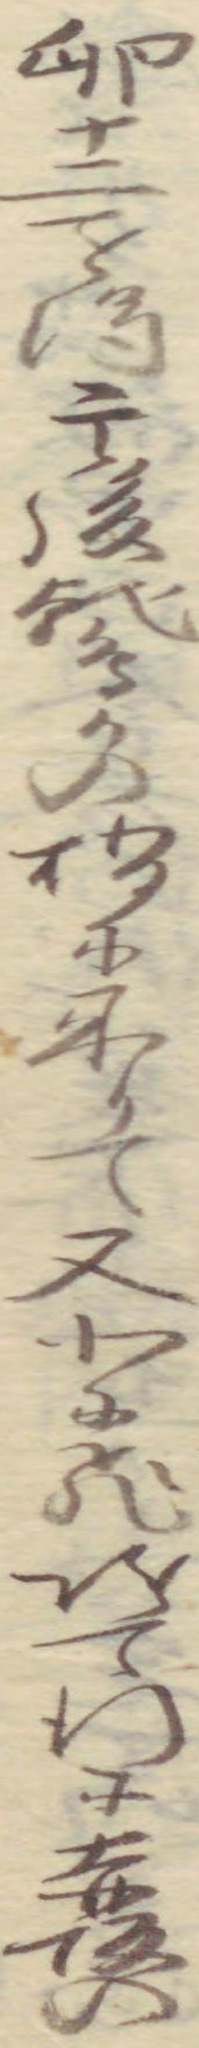卵十二を得て後鷲かの梢に来りて又北に飛越て行に赤坂の
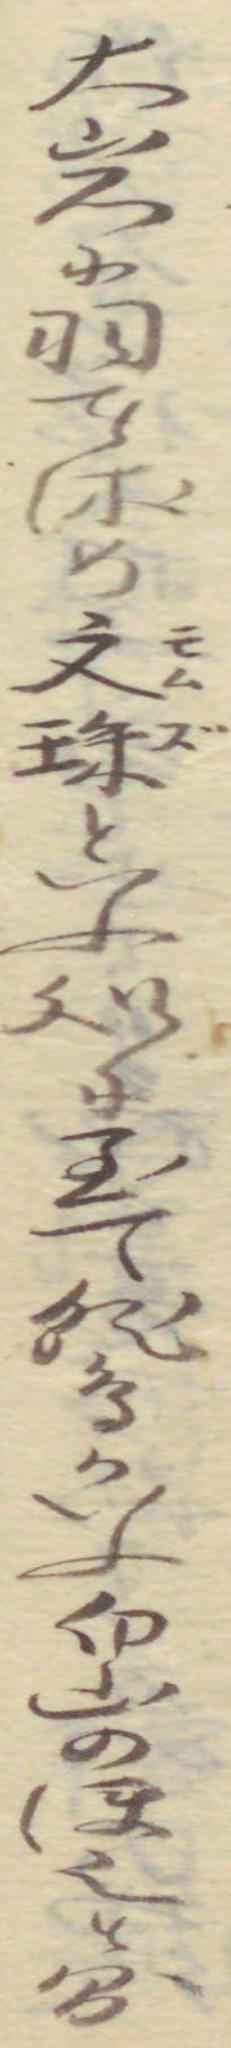大岩に羽を休め文珠といふ処に至て鷲かいふ白山の使也と則
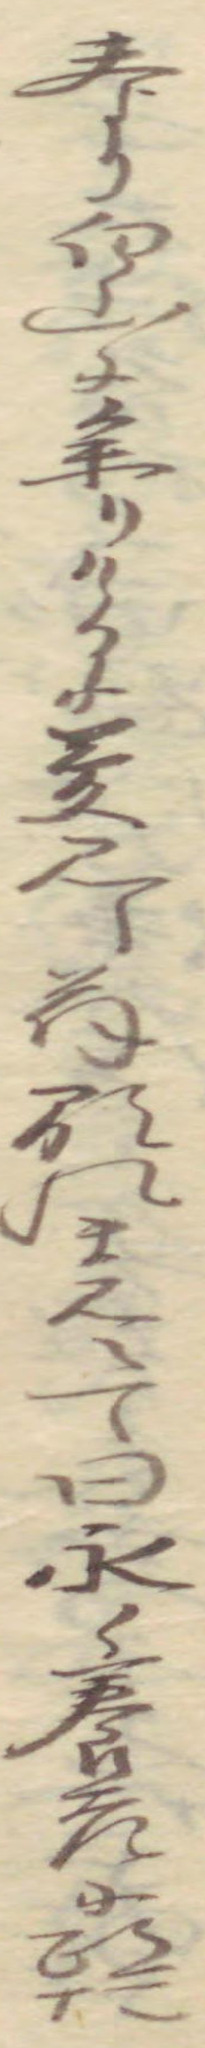夫より白山に参りけるに夢見し翁顕れま見えて曰永く養老に跡た
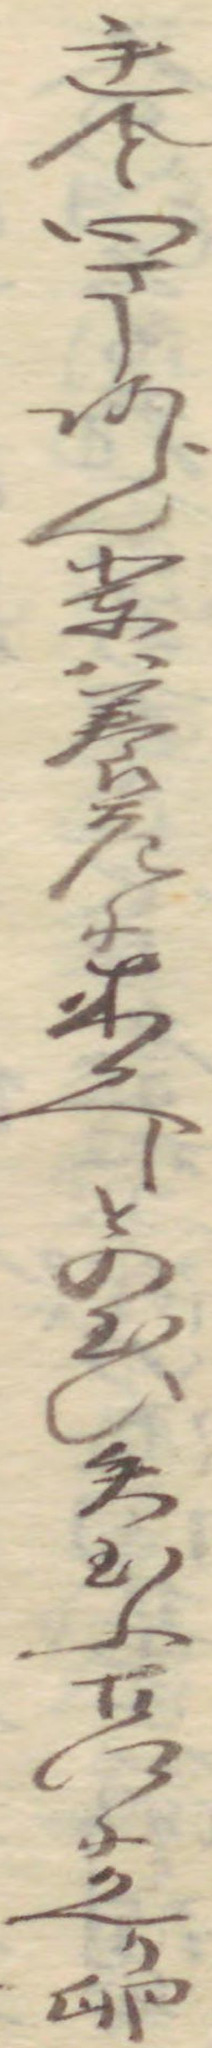れんと心さしあらん輩は養老に来るへしとの玉ひ告玉ふ古郷にかへり卵
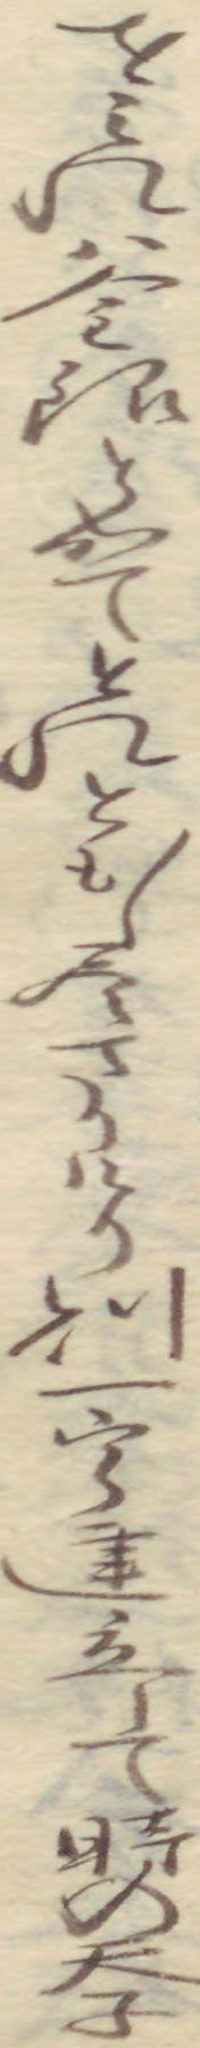をみれは金銀と成てとれとも〳〵尽さりけり則一宇建立して時の天子
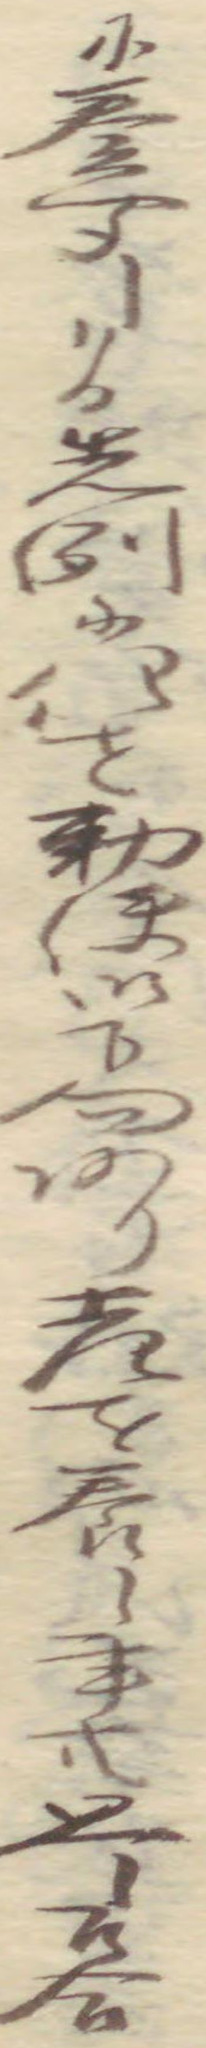に奏聞しける先例に任せ勅使御下向あり老を養し事共思し召合
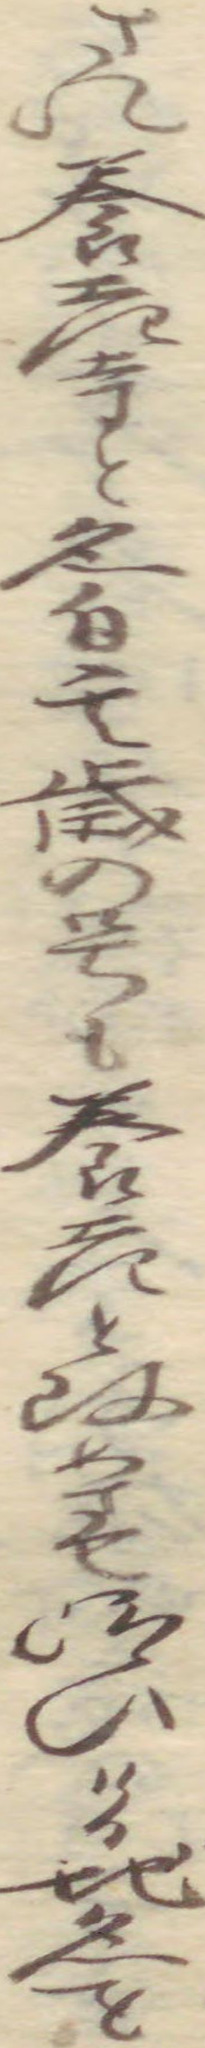され養老寺と名付其歳の号も養老と改めさせ給ひける地名を
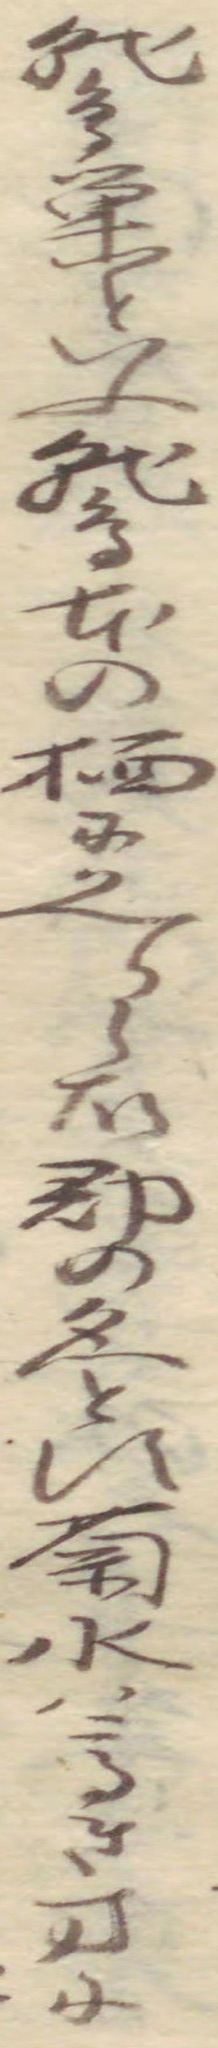鷲巣といふ鷲本の栖にかへりし故郡の名とす菊水は高き方に
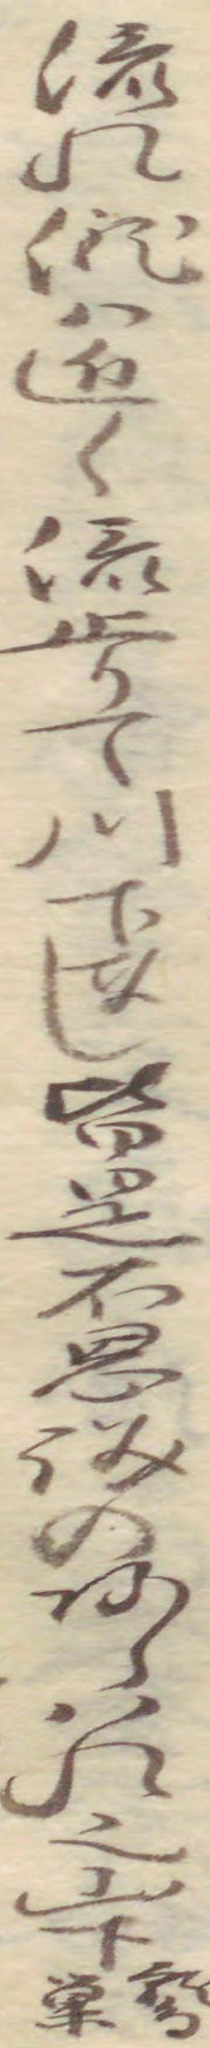流れ滝は近く流止りて川下なし皆是不思議のあらはれ也山下鷲巣
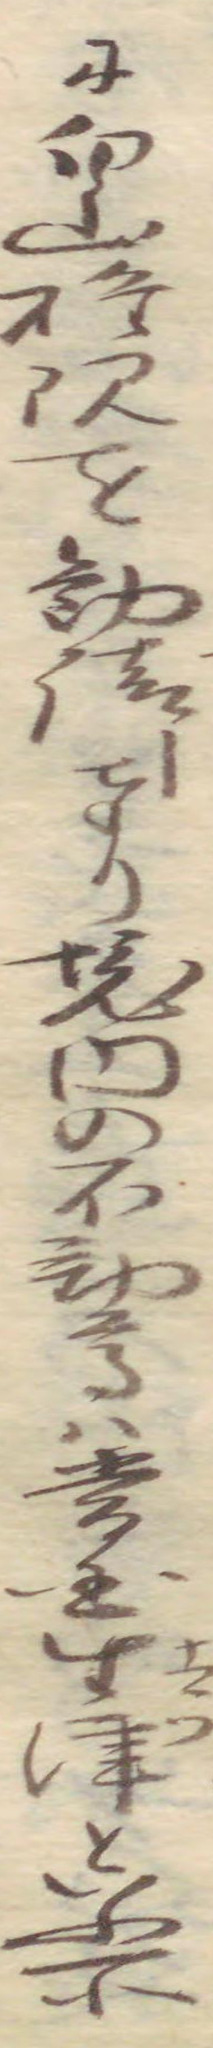に白山権現を勧請し奉り境内の不動寺は当国生津といふ処
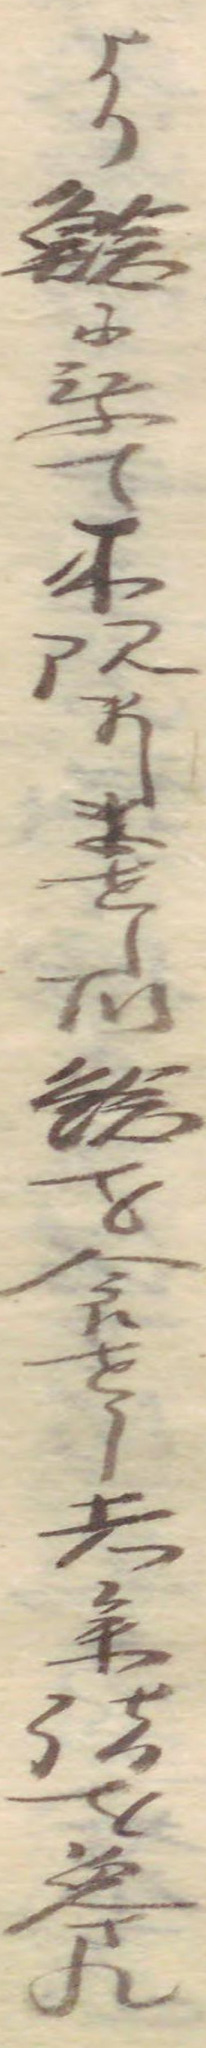より鯰に乗て来現よしまをし故鯰を食せし者参詣を免され
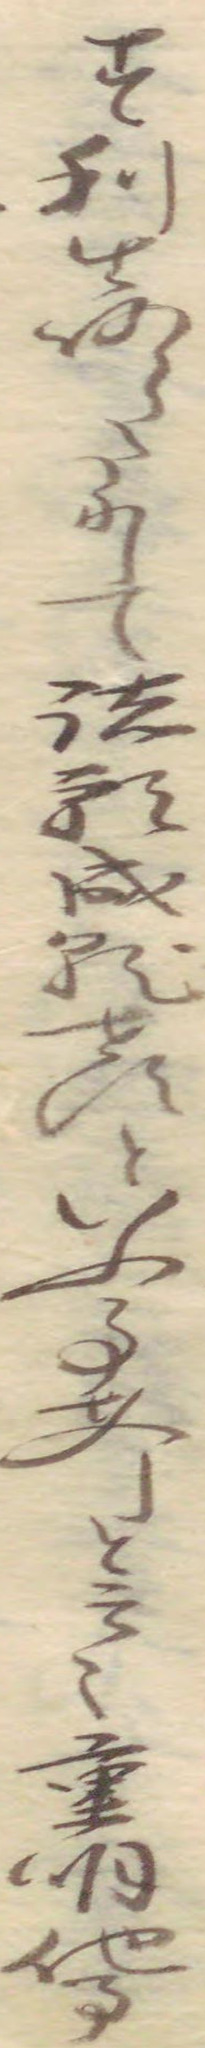す利生あらたにして諸願成就せすといふ事なしと云〻重明他事
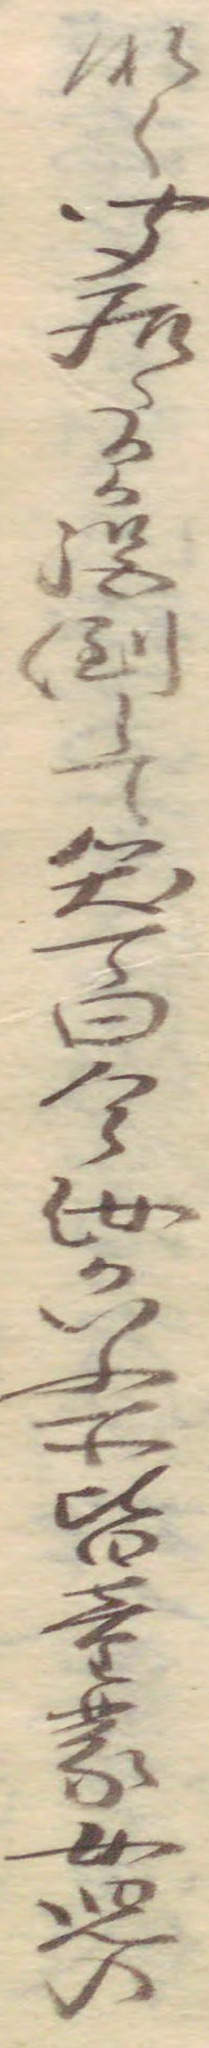なく聞居たるか絶倒して笑て曰今汝かいふ所皆童蒙女児の

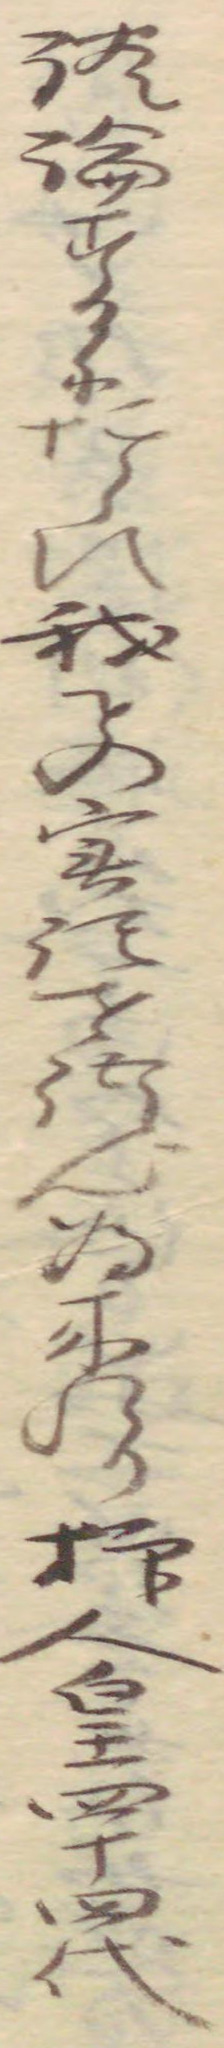語論するにたらす我その実話を語ん為来れり抑人皇四十四代
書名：鶯宿雑記. 巻263-264
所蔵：国立国会図書館 National Diet Library, JAPAN
